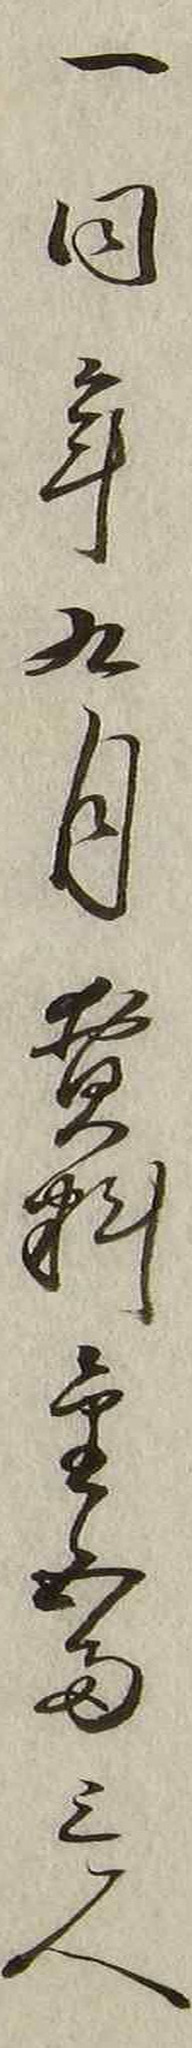一同年九月費料金五両三人
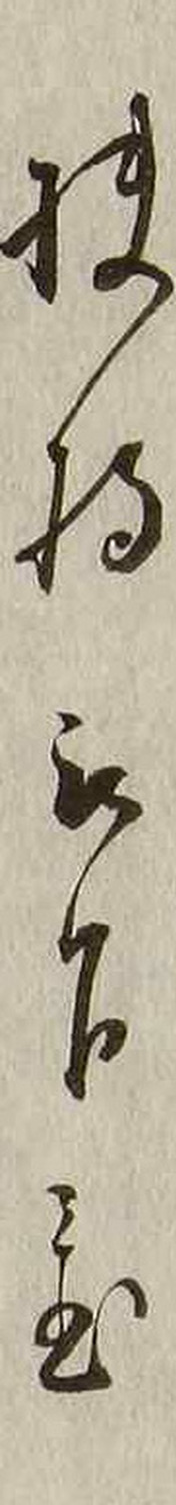扶持被下置
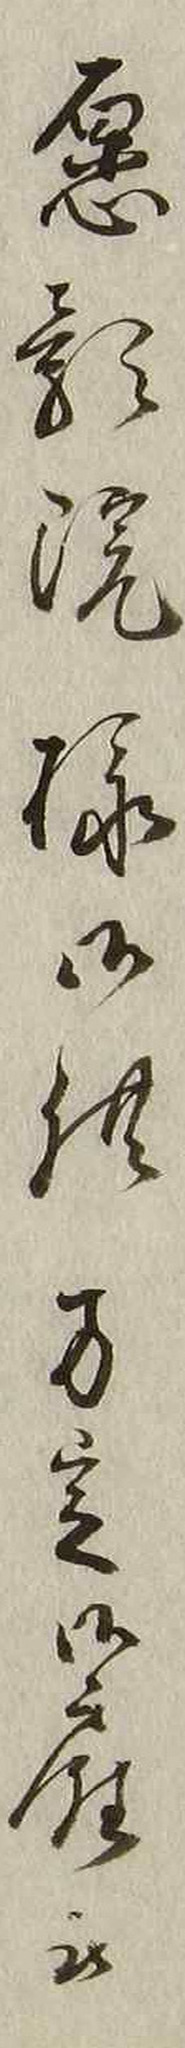愿彰院様御供方定御雇被
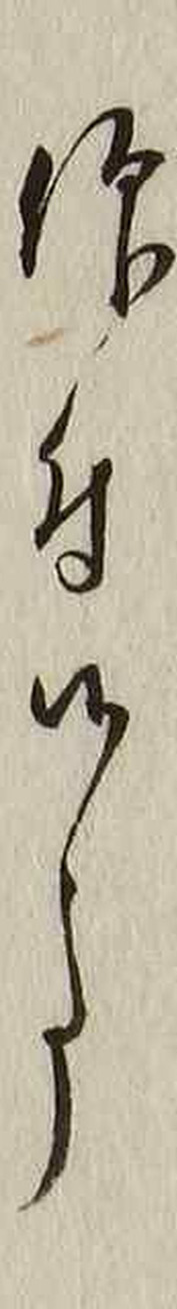仰付候事
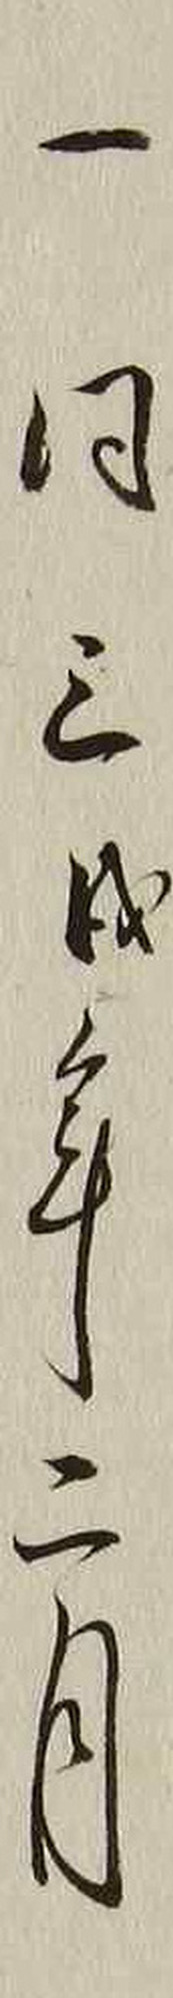一同三戌年二月
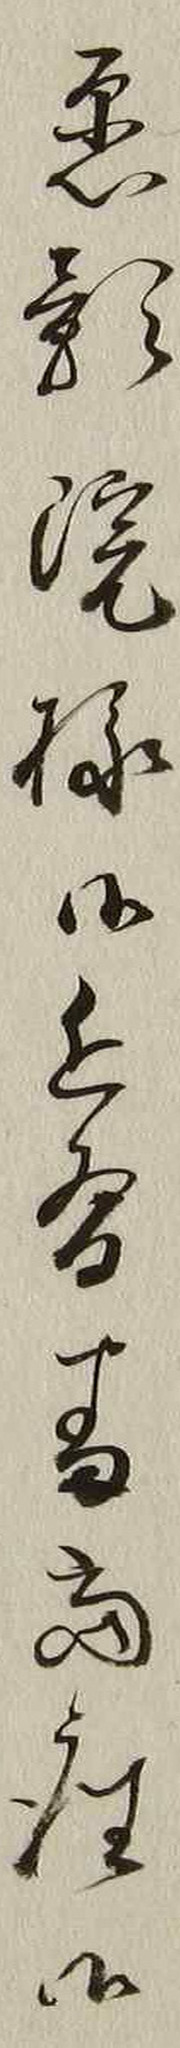愿彰院様御近習番当座御
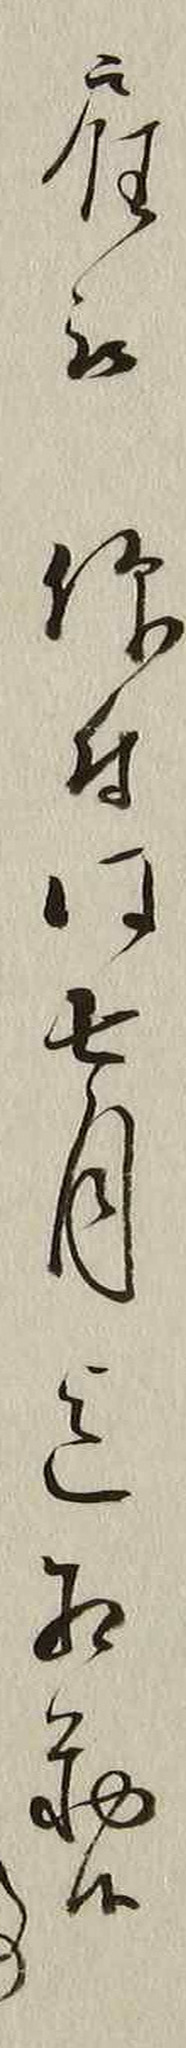雇被仰付同七月迄相勤候事
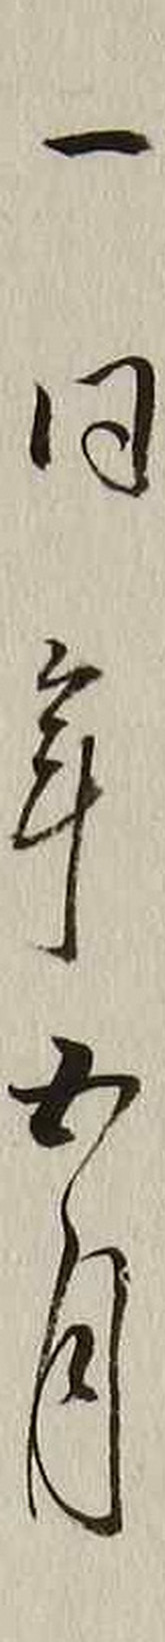一同年五月
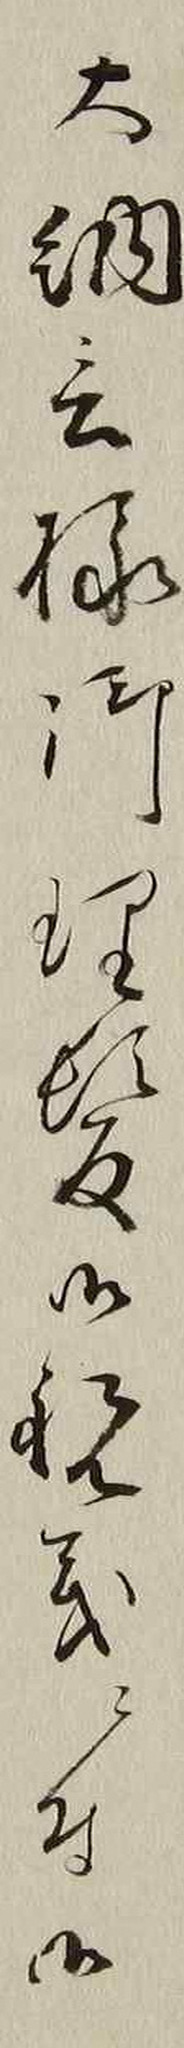大納言様御理髪御祝義に付御
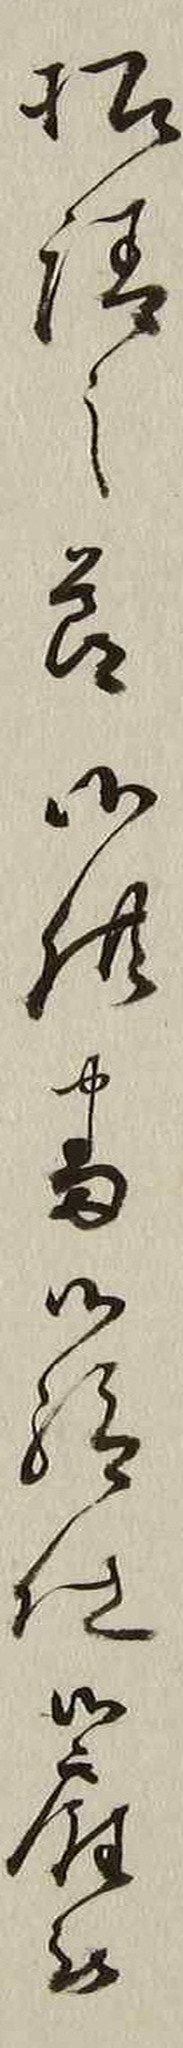招請之節御供番御給仕御雇被
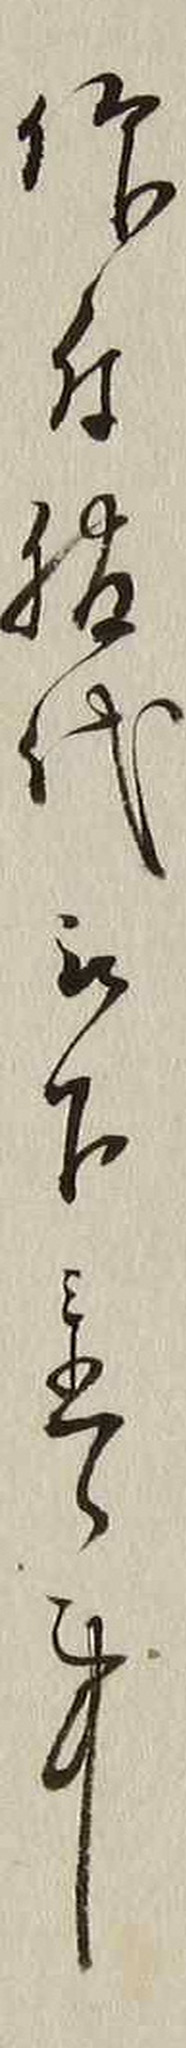仰付服代被下置候事
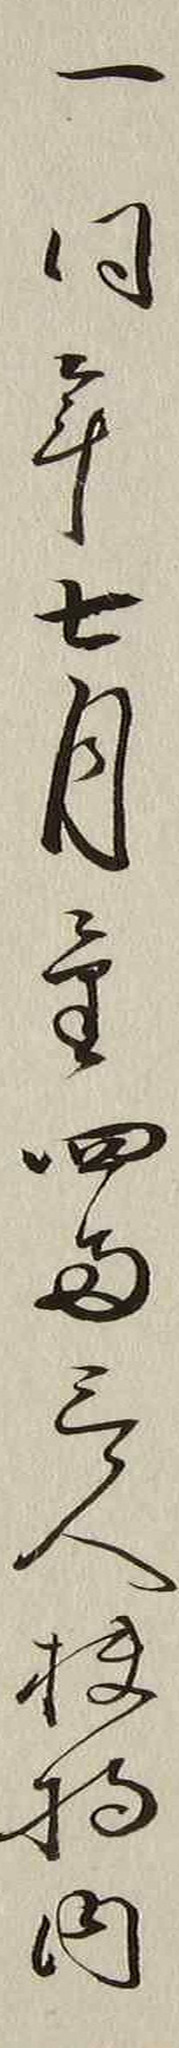一同年七月金四両三人扶持内
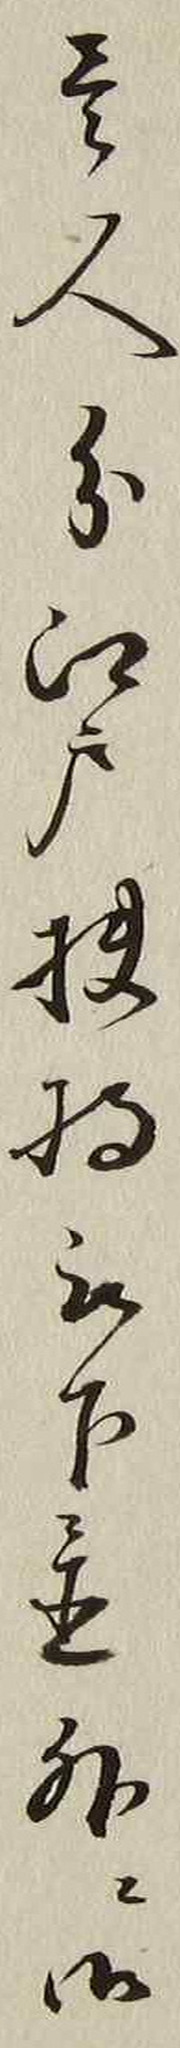壱人分江戸扶持被下置外に御
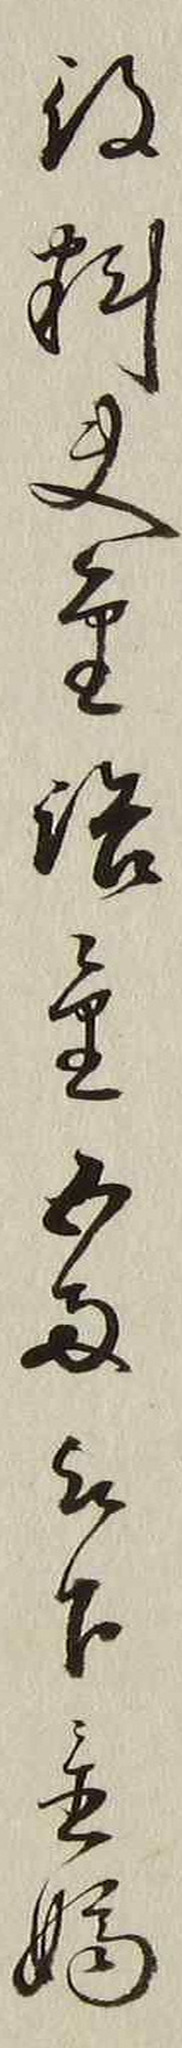役料夫金詰金五両被下置嫡
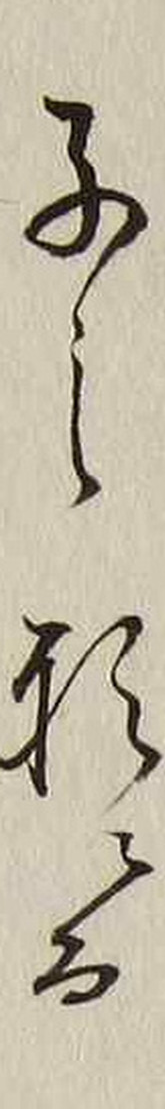子之願に而
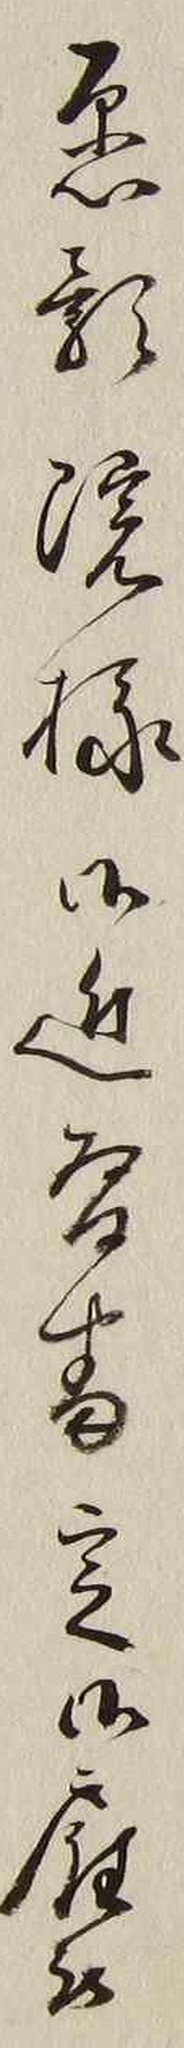愿彰院様御近習番定御雇被
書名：諸士系譜　巻之158　ね之部2
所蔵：会津若松市立会津図書館
